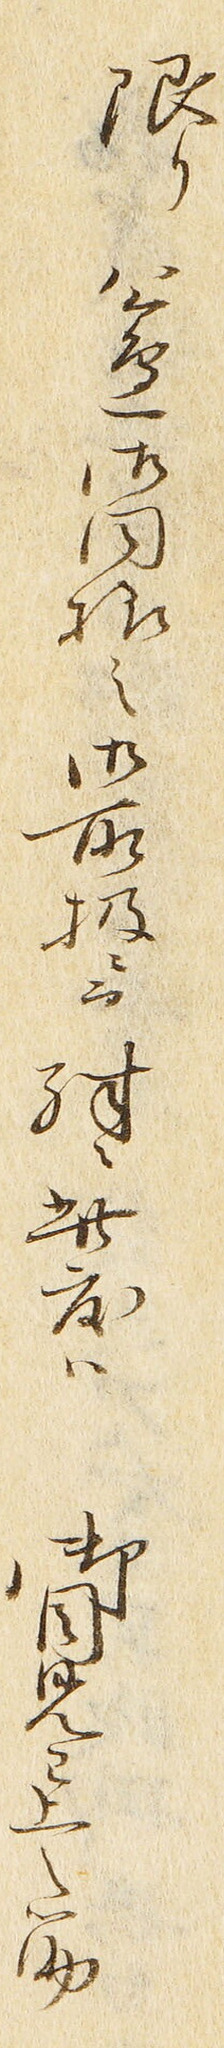限り公辺御同様之御取扱に而殊にこ此度は御目見已上之筋
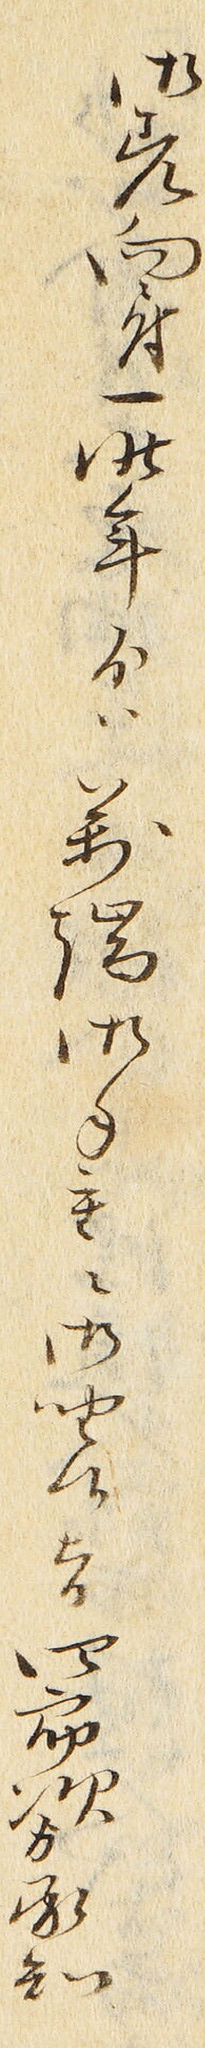御差向に付一昨年ゟは万場御手重に御座候は四郎次方承知
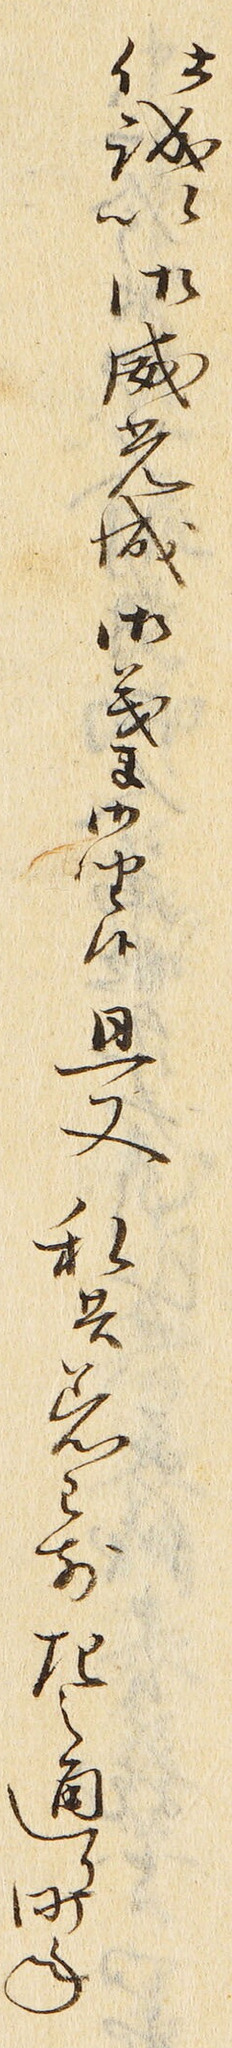仕誠以御威光域御義に御座候且又私共着已前左之通り昨年
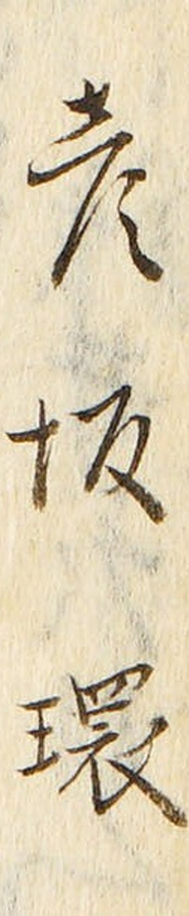彦坂環
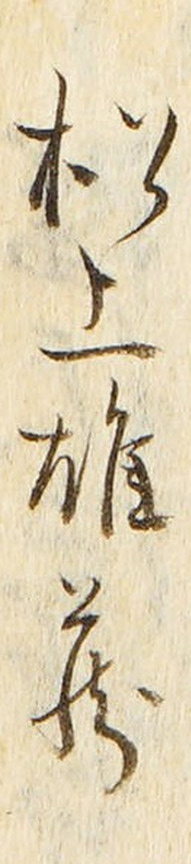松上雄蔵
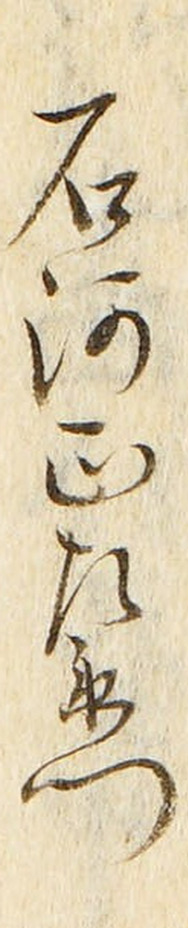石河正左衛門
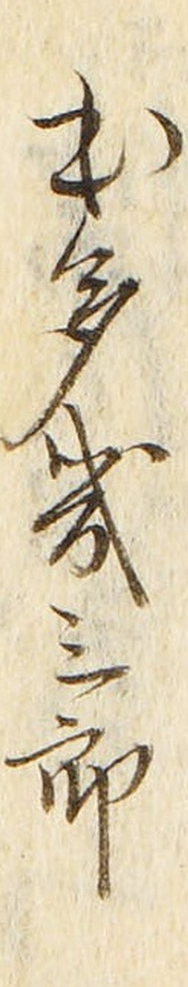出多幾三郎
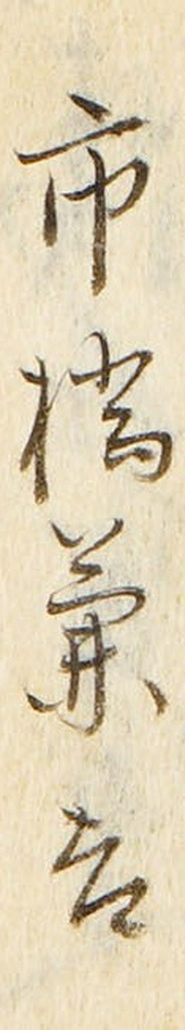市橋兼吉
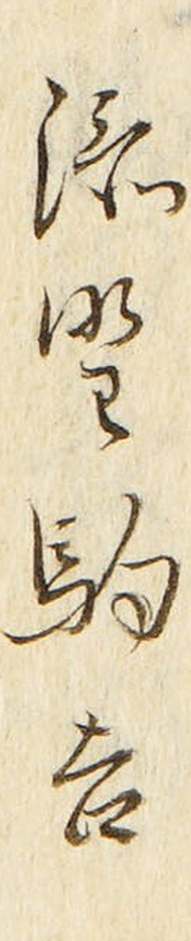添野駒吉
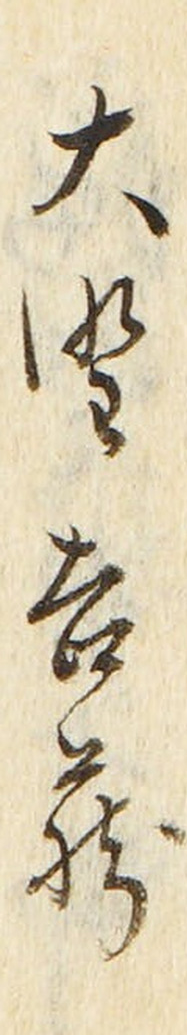大野吉蔵
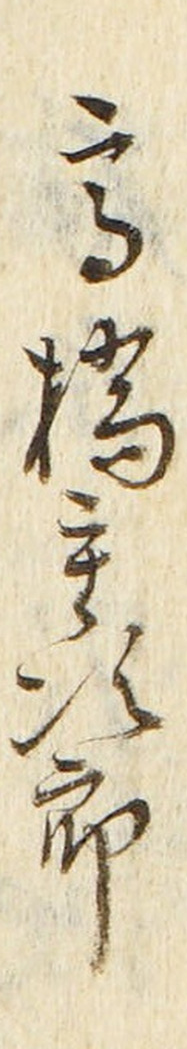高橋重次郎

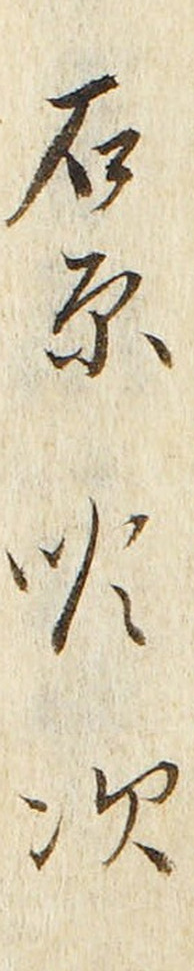石原唯次
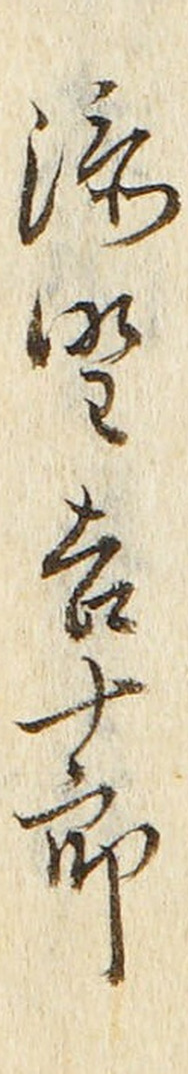添野吉十郎
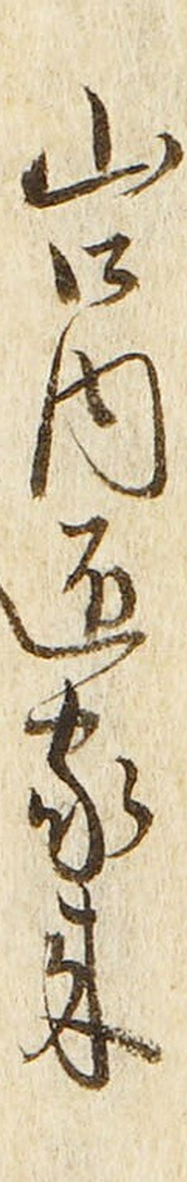山口内通家来
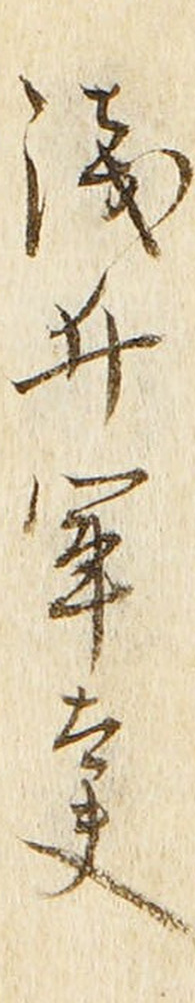浅井軍太夫
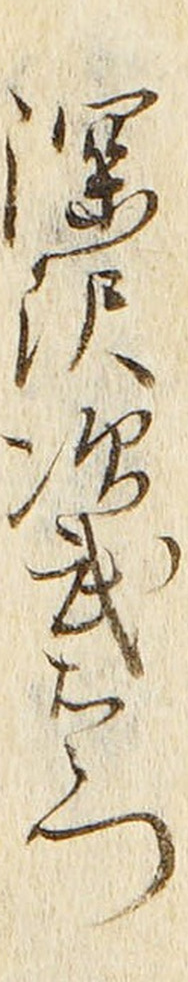深沢次武右衛門
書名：長崎漂流記
